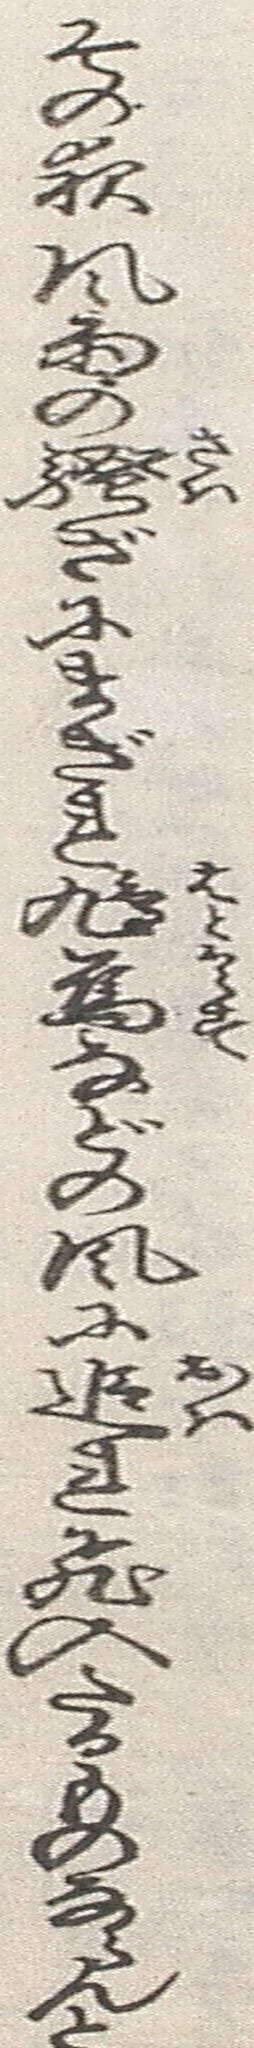その夜風雨の騒ぎにまぎれ鳩烏などの風に追れ飛入たるものならんと
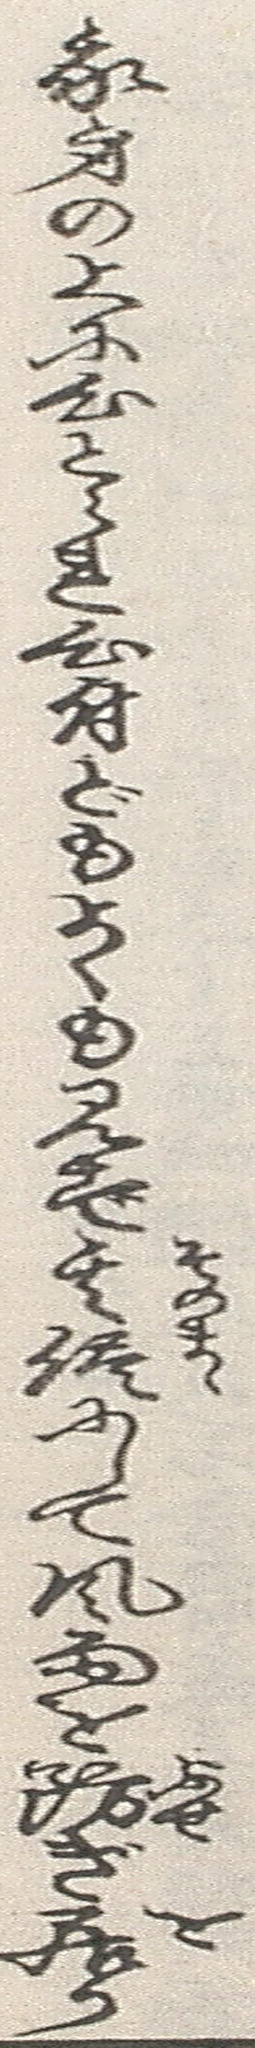我身の上に心とられ心付どもよくも見ず其侭にて風雨を防ぎ居り
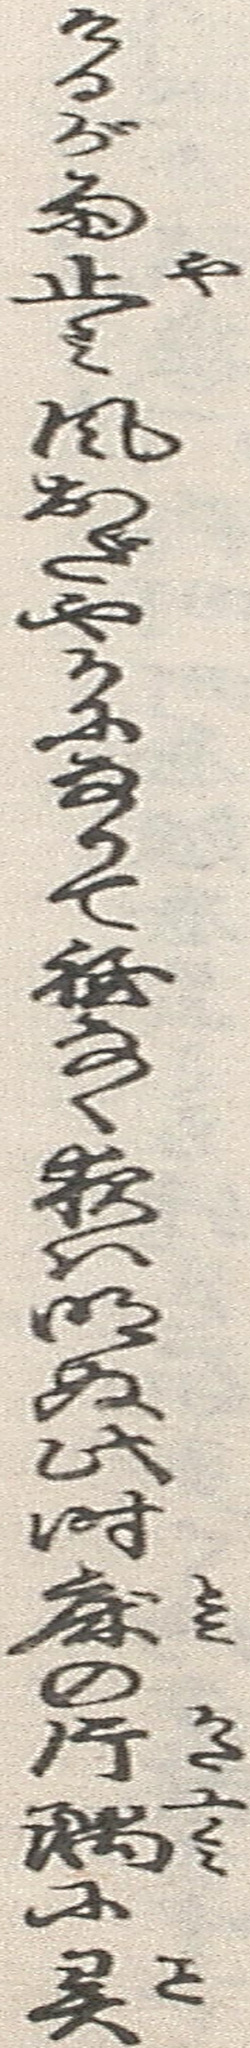けるが雨止ミ風おだやかになりて程なく夜ハ明ぬ此時床の片隅に異
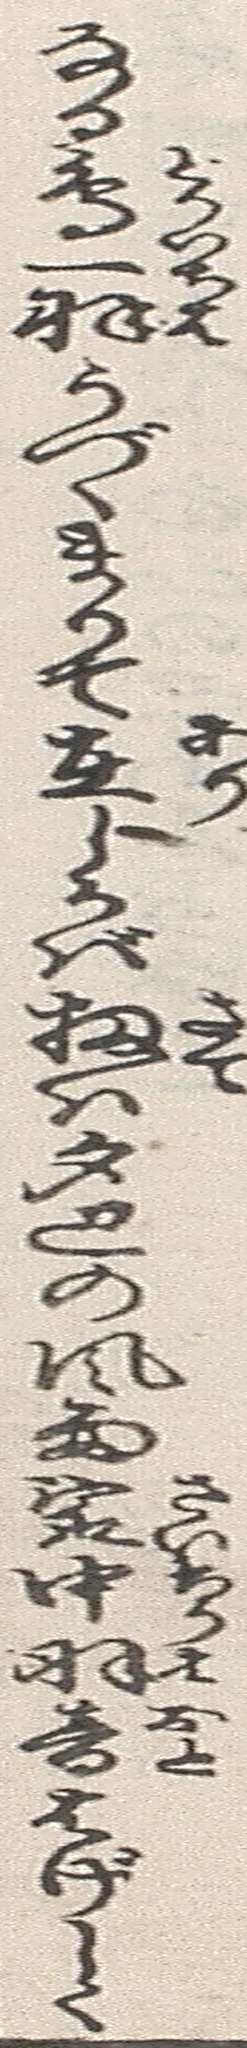なる鳥一羽うづくまりて在しかバ扨ハ夕辺の風雨最中羽音はげしく
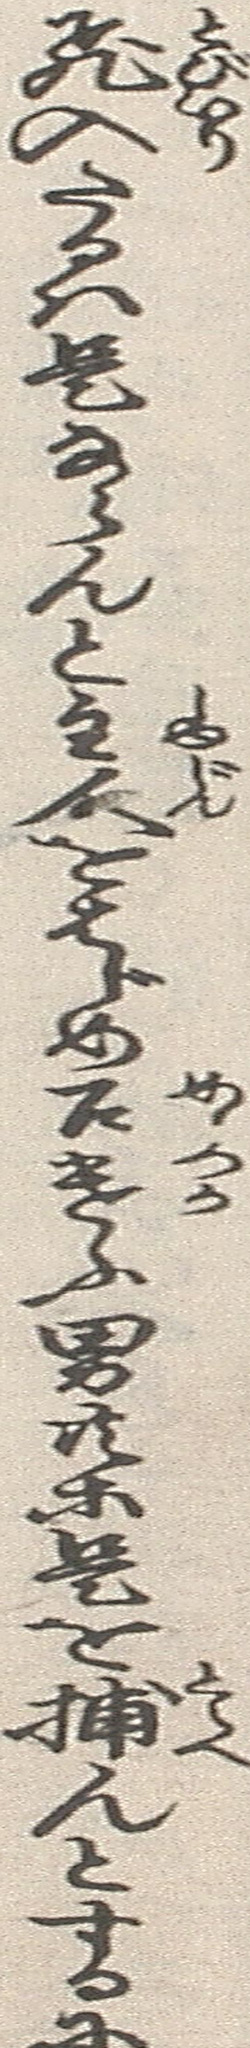飛入たるハ是ならんと主人をはじめ召遣ふ男共是を捕んとするに
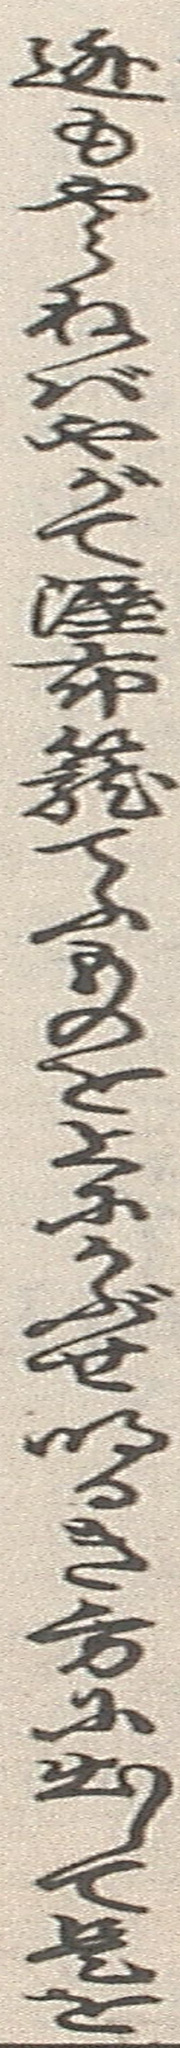逃もやらねバやがて湿布籠てふものを上にかぶせ明るき方に出して是を
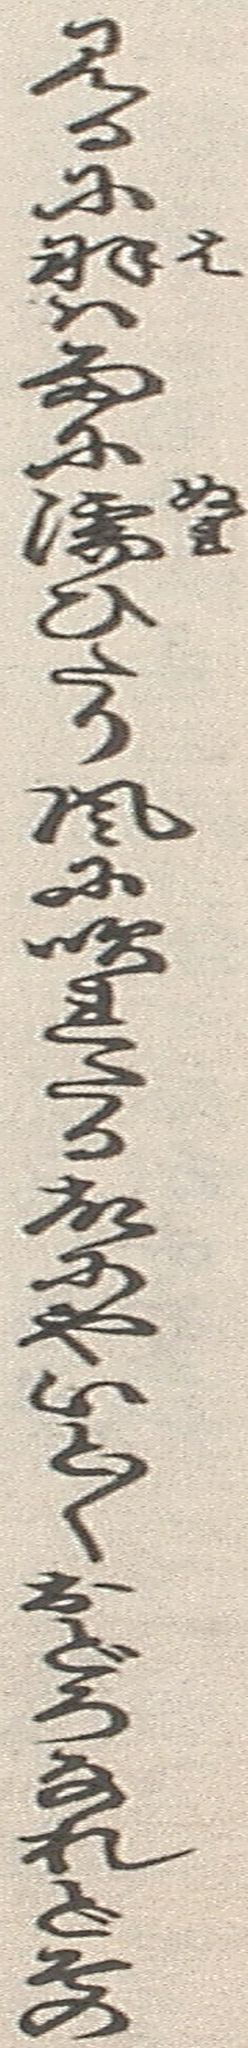見るに羽ハ雨に濡ひたり風に吹れたる故にやいと〳〵おどろなれどその
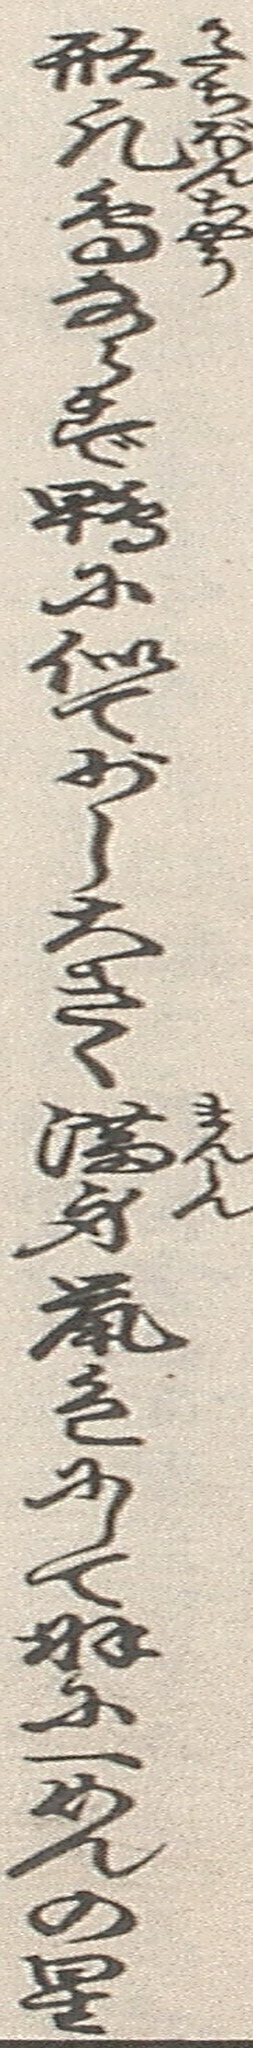形凡鳥ならず鴨に似て少し大きく満身鼠色にて羽に一めんの星
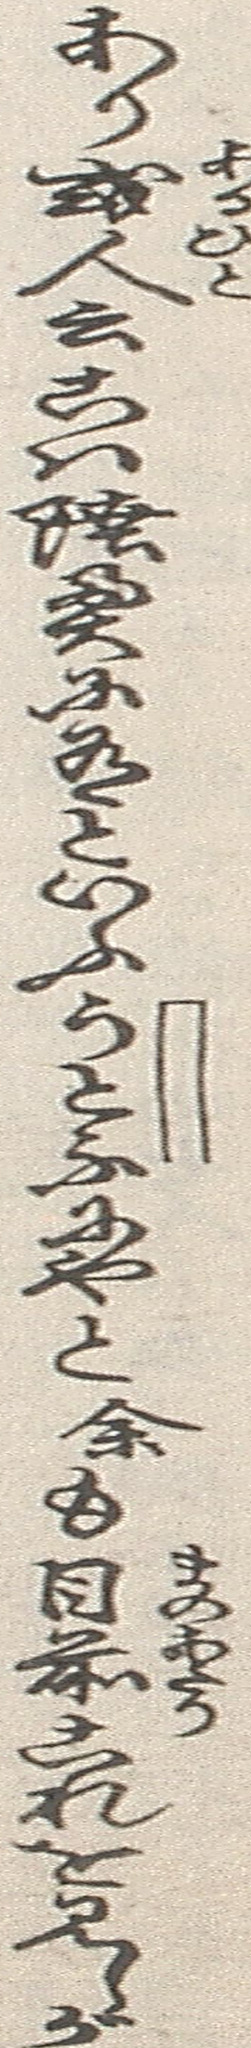あり或人云こハ陸奥に有といふうとふにやと余も目前これを見しが
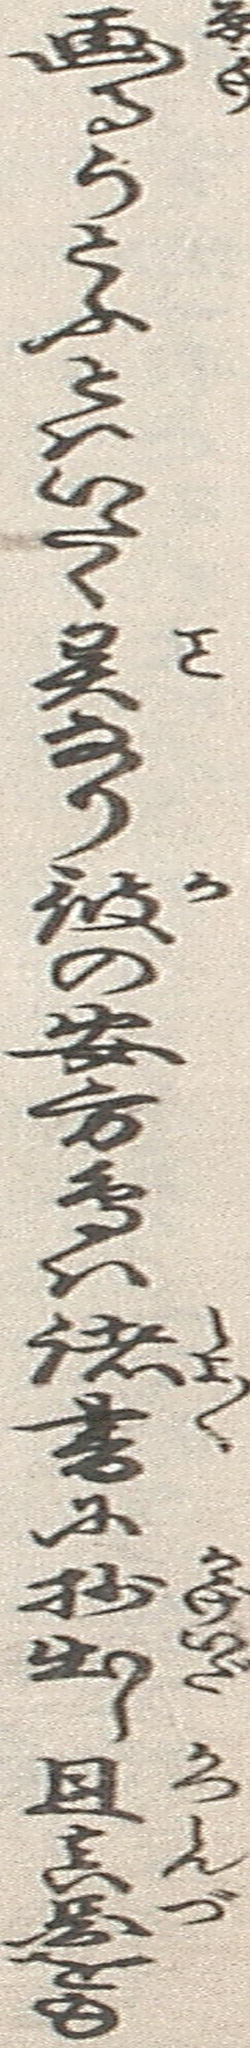画るうとふとハいたく異なり彼の安方鳥ハ諸書に抄出し且真図をも
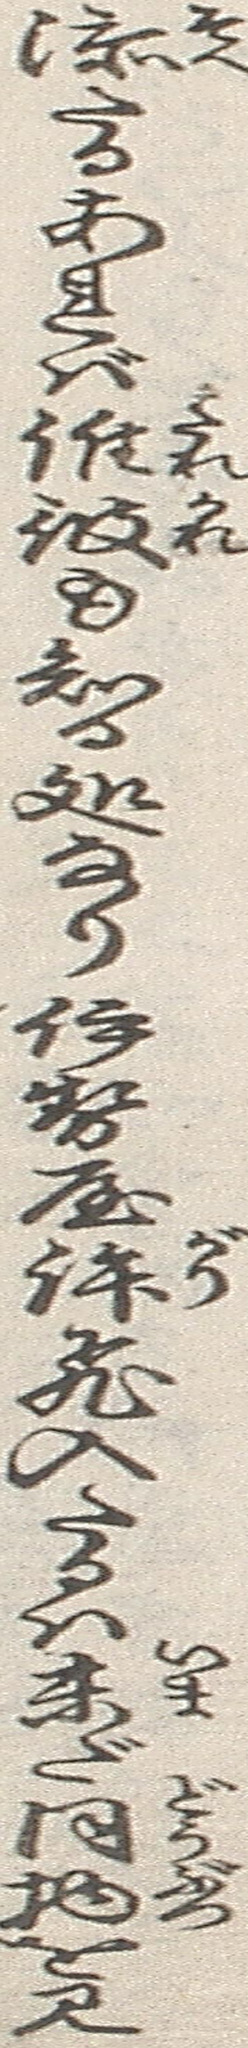添たるあれバ誰彼も知る処なり伊勢屋許飛入たるハ未だ同物を見
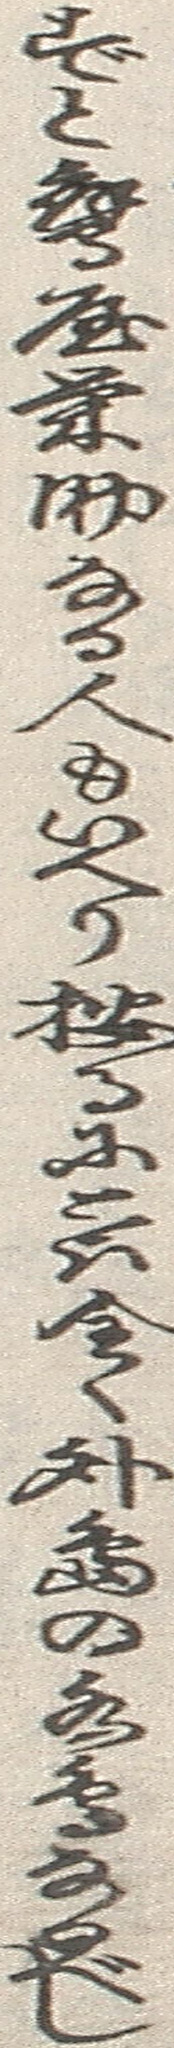ずと鷹？屋栄助なる人もいへり按るにこハ全く外嶋の鳥なるべし
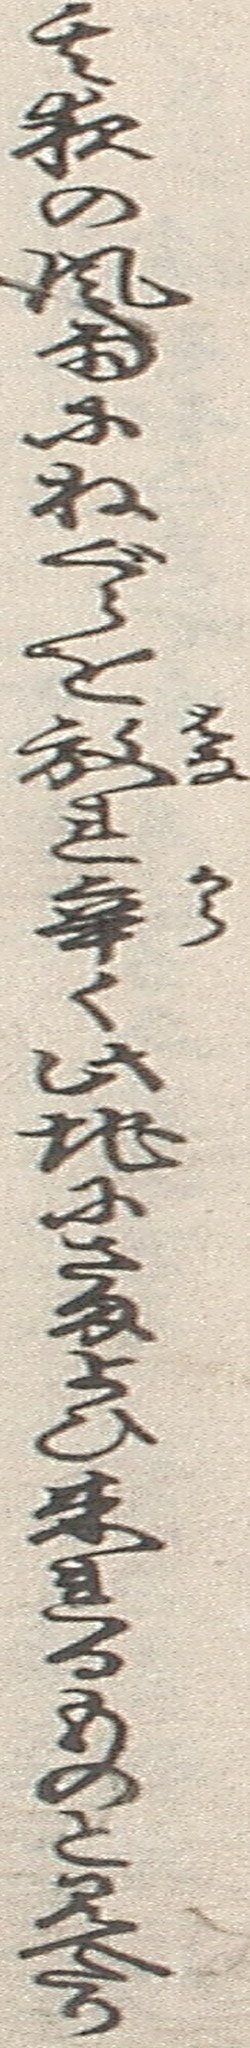其夜の風雨にねぐらを放れ辛く此地にさまよひ来れるものと見合へたり
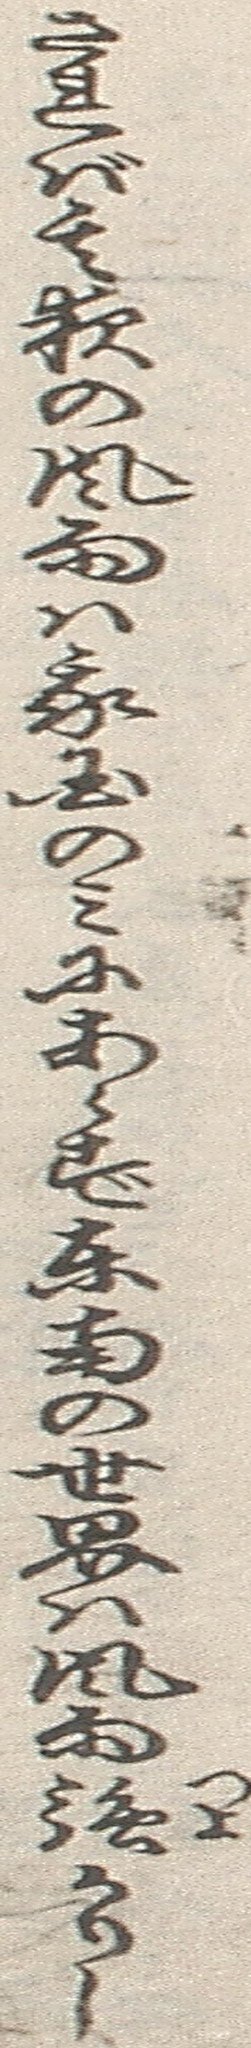されバ其夜の風雨ハ我国のミにあらず東南の世界ハ風雨強かりし
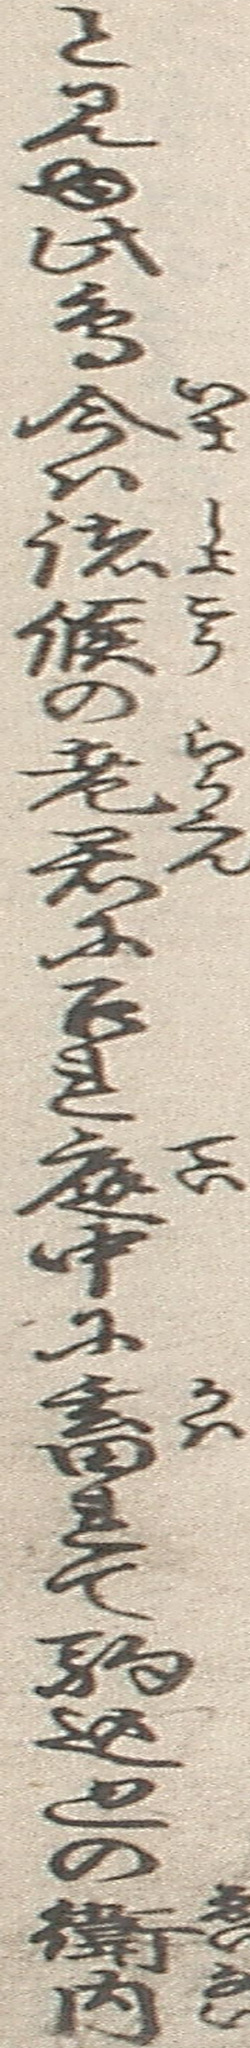と見ゆ此鳥今ハ諸候の老君に召れ庭中に畜れて駒込辺の衛内

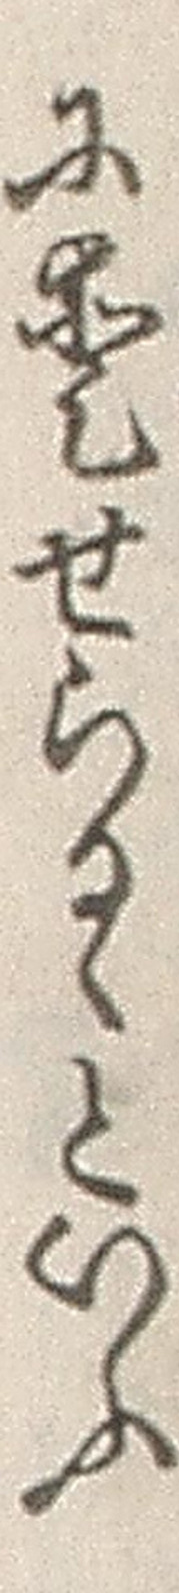に愛せらるゝといふ
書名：安政風聞集　上中下　全
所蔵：東京大学地震研究所図書室 Earthquake Research Institute Library, The University of Tokyo, JAPAN
